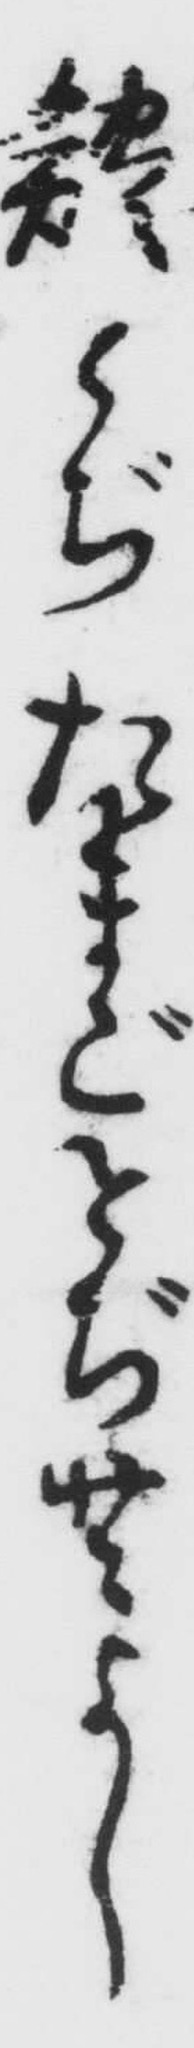鱧くぢたまごとぢ些よし
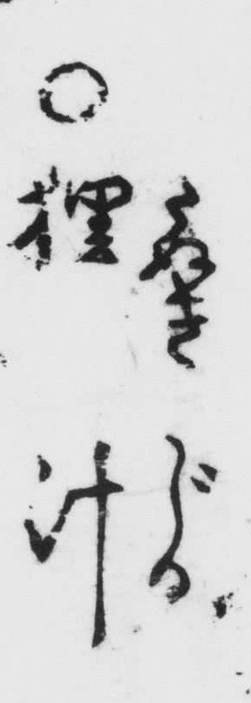○狸汁
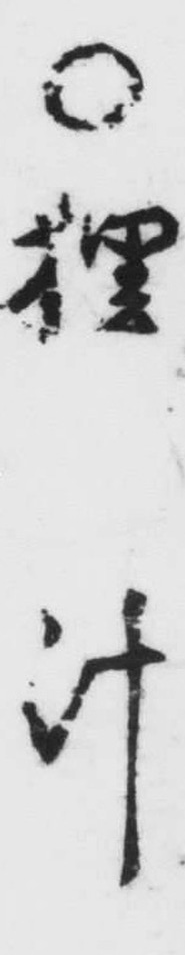○狸汁
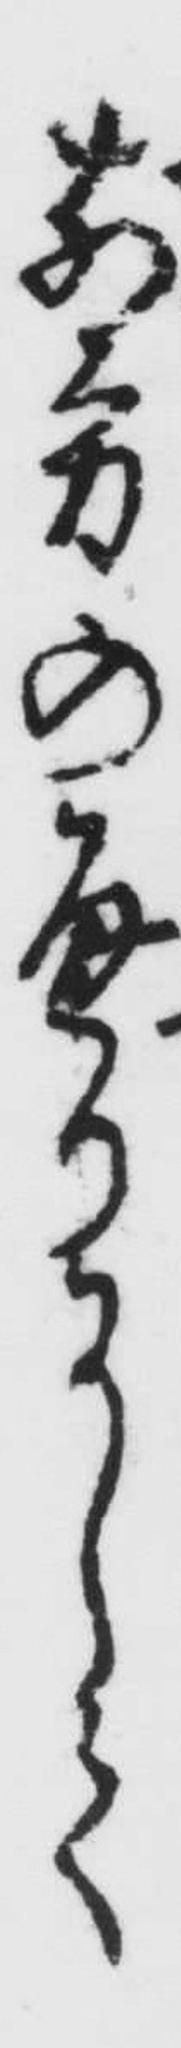前方の通りにして
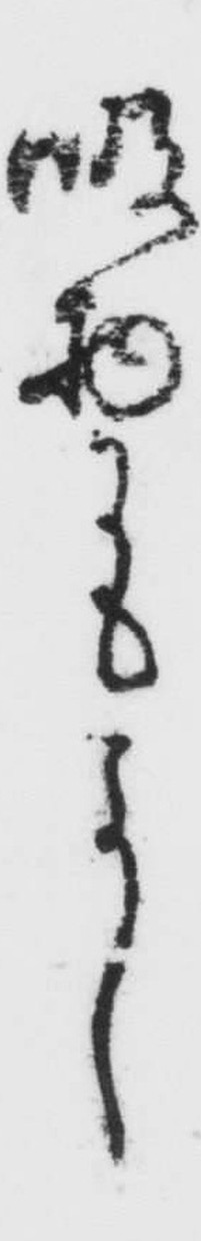吸物にもよし
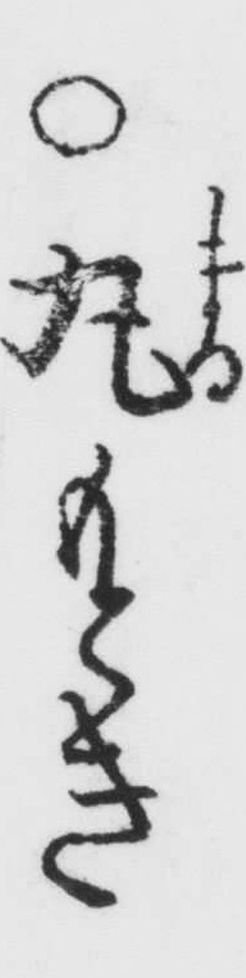○丸もとき
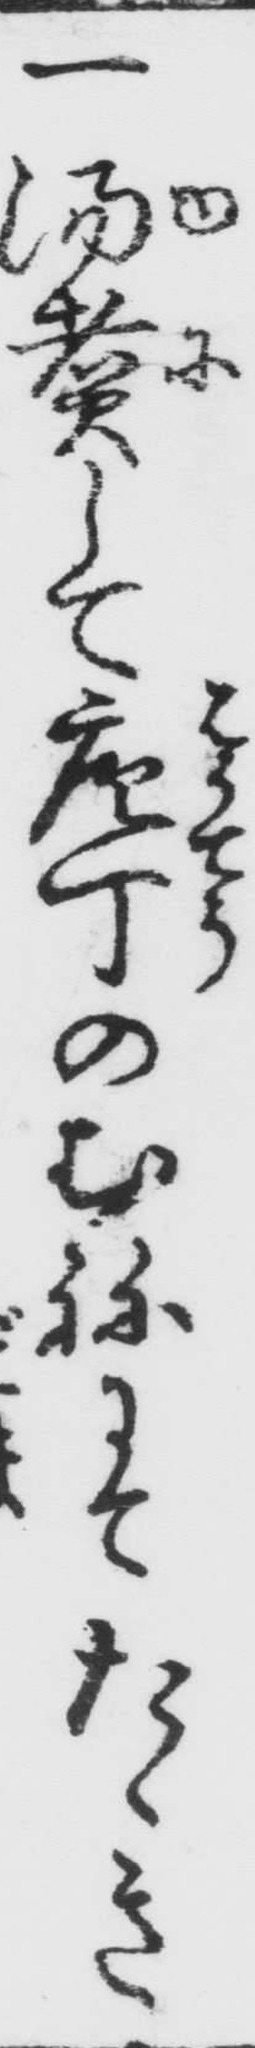一湯煮して庖丁のむねにてたゝき
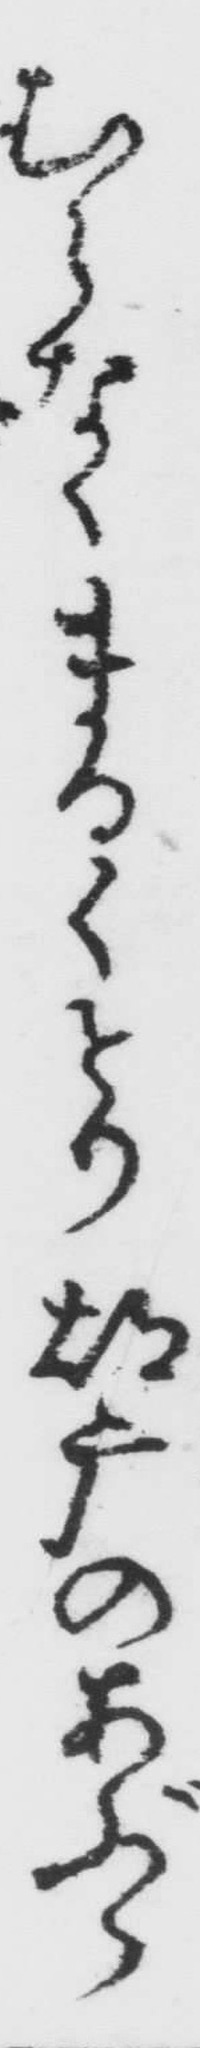むらなくまるくとり胡麻のあぶら
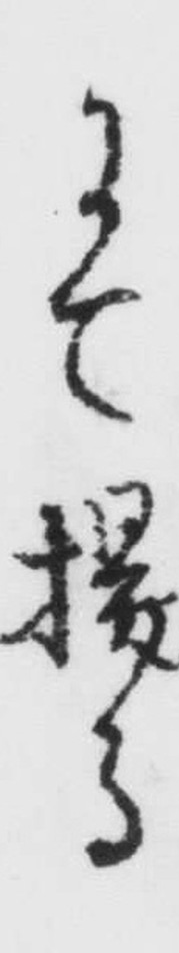にて揚る

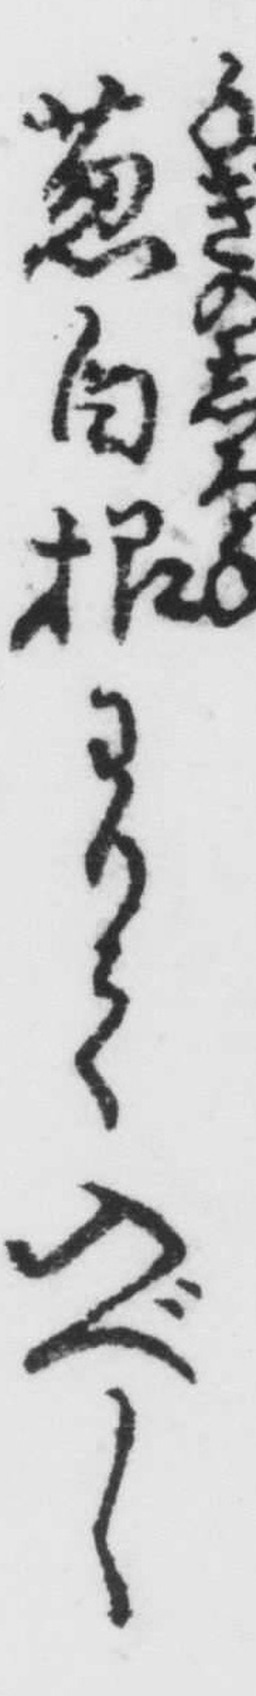葱白根わりて入べし
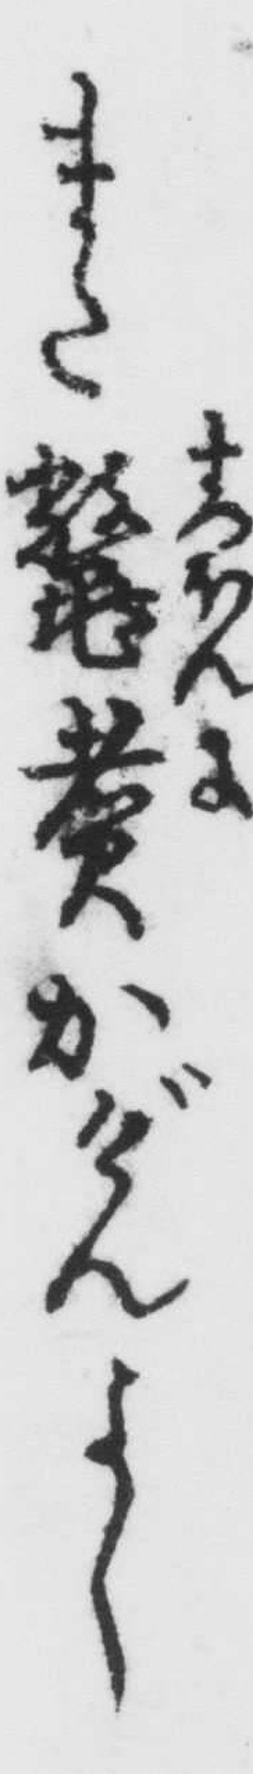また鼈煮かげんよし
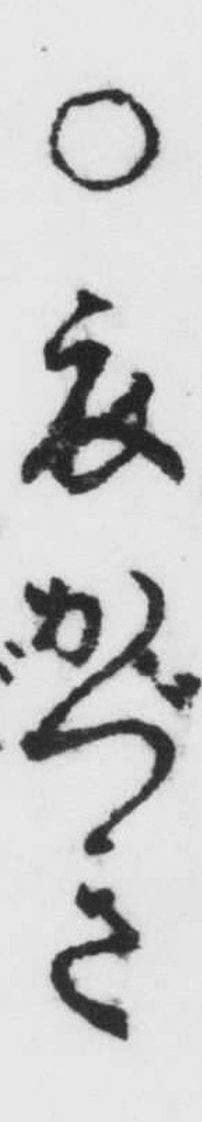○衣かづき
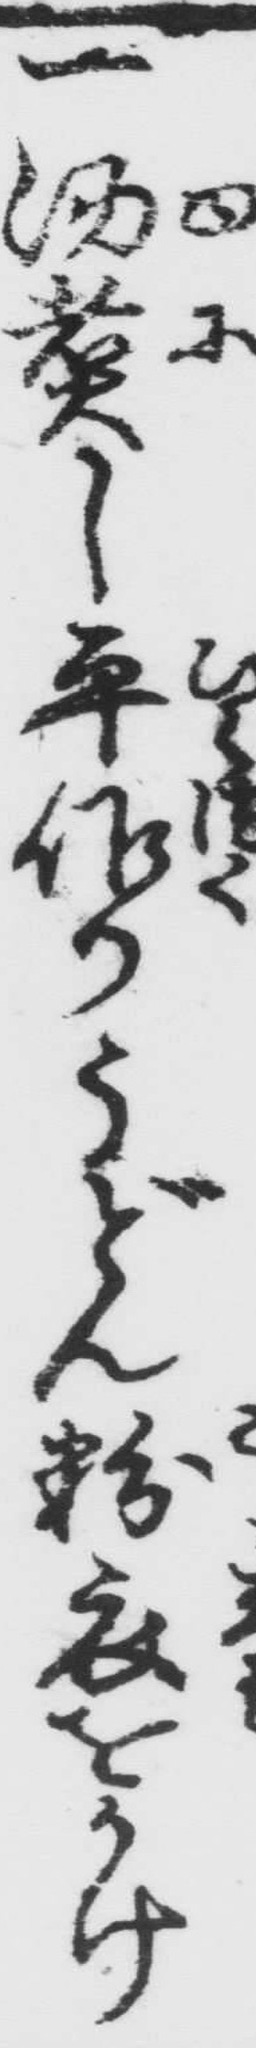一湯煮し平作りうどん粉衣をかけ
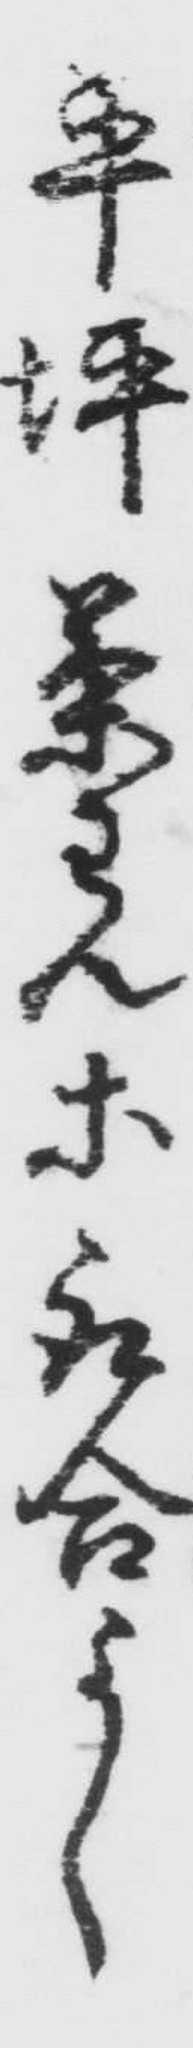平坪茶わん等取合よし
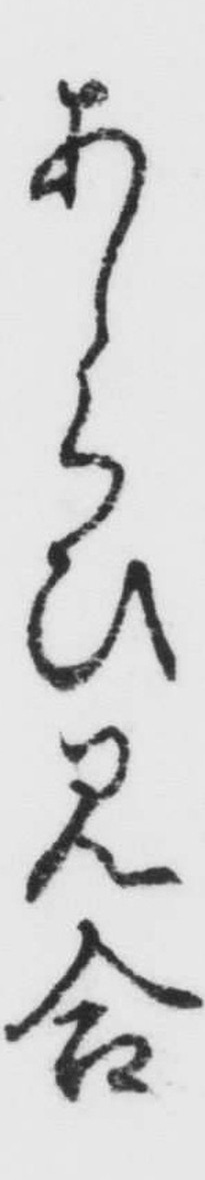あしらひ見合
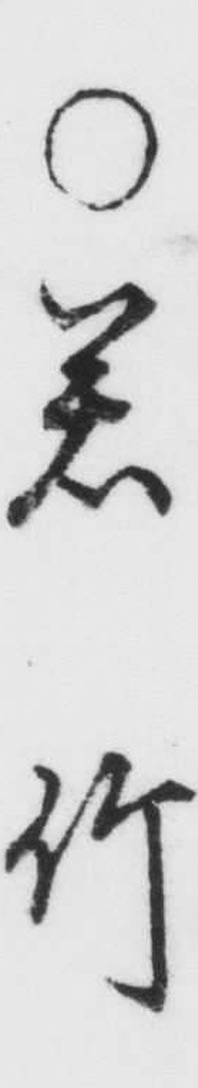○若竹
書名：蒟蒻百珍
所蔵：大阪府立大学学術情報センター 国文学研究資料館
